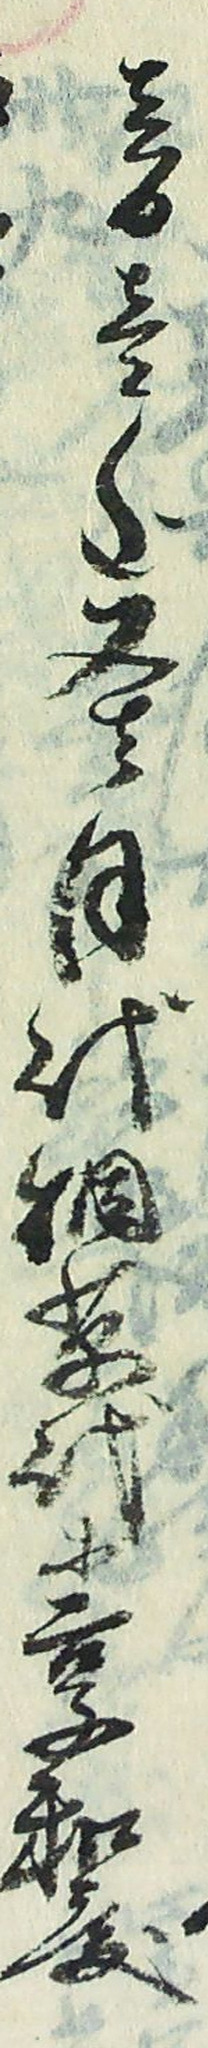壱日壱匁又者月代烟草代等享和度
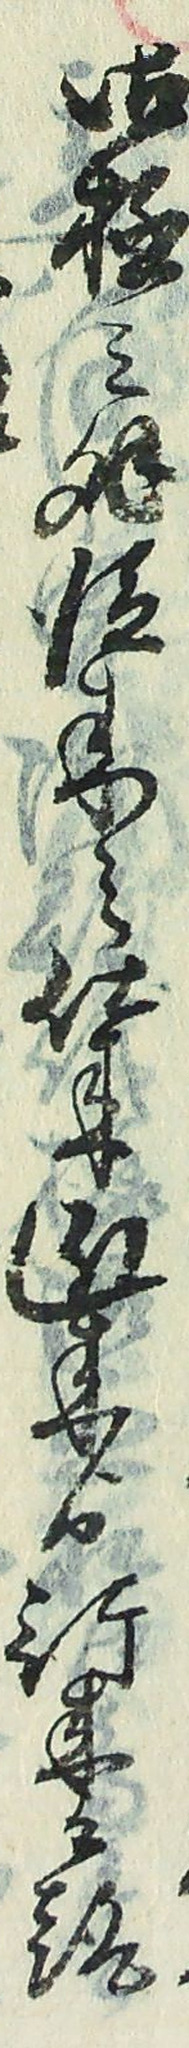御極之外従来之仕来近来ゟ行来候趣
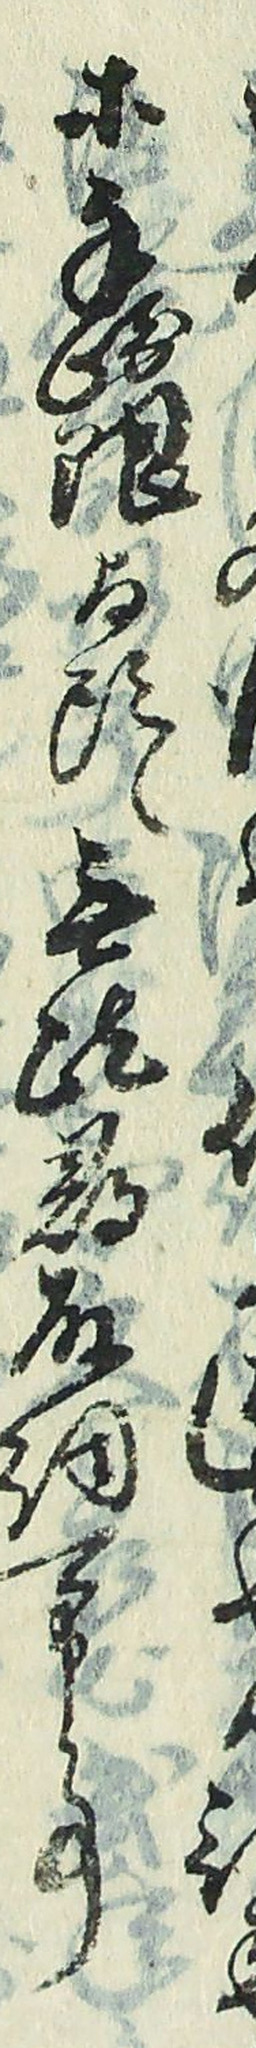等手崎限与頭へ無屹尋取調可申事
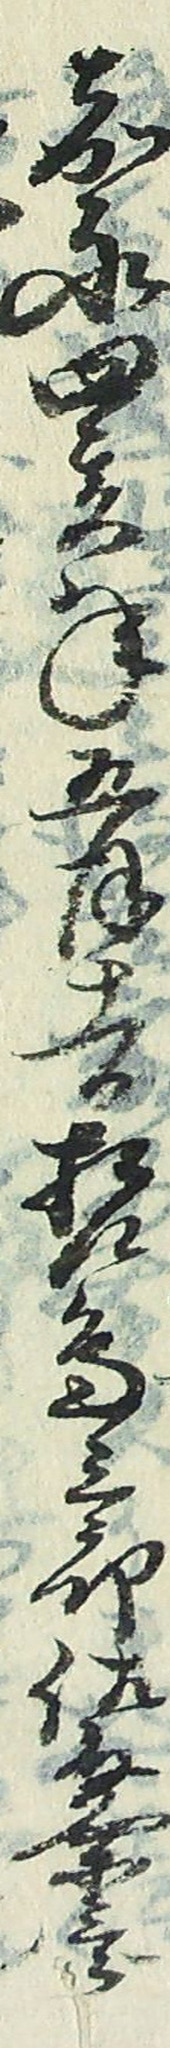嘉永四亥年五月十一日松江島三郎佐藤粂三郎
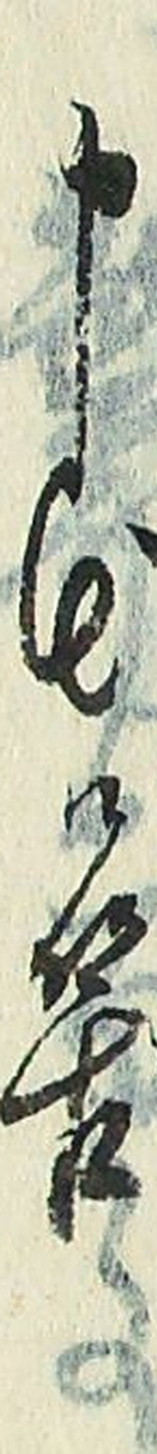申出候筈
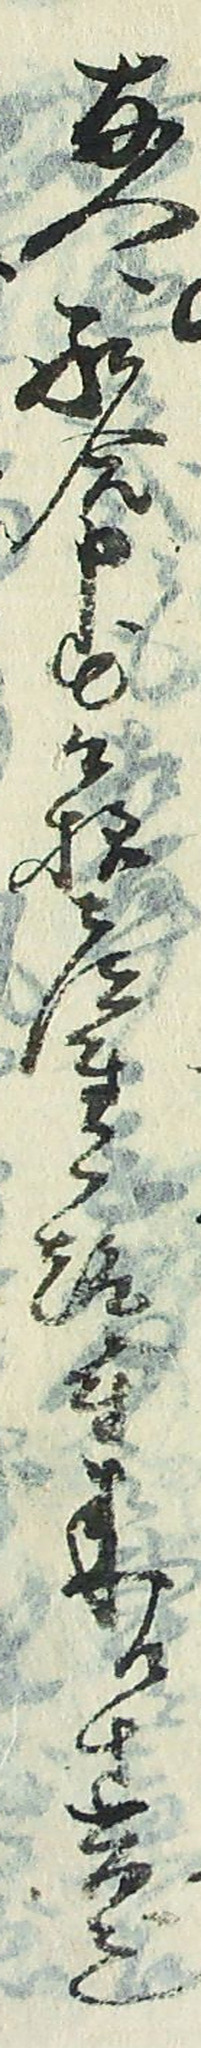両人へ承合申出候様被仰付候趣ニ付来ル十六日迄

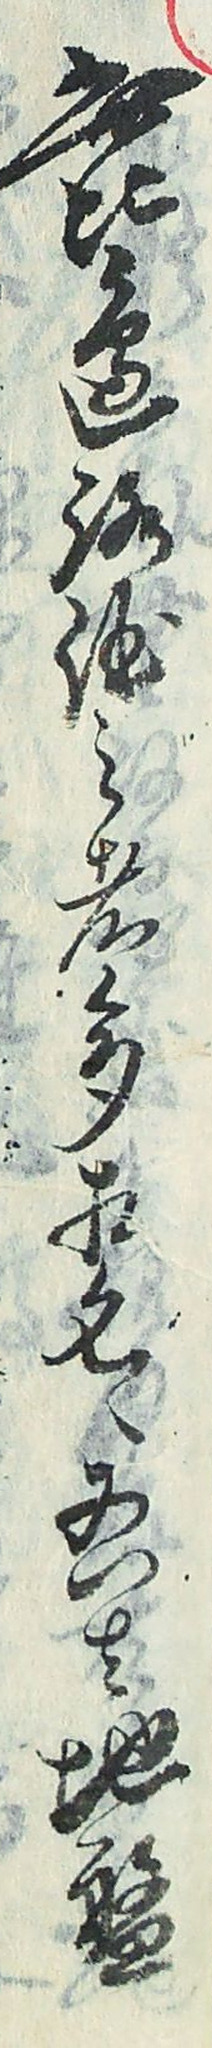此比邊路体之者多相見へ右者地盤
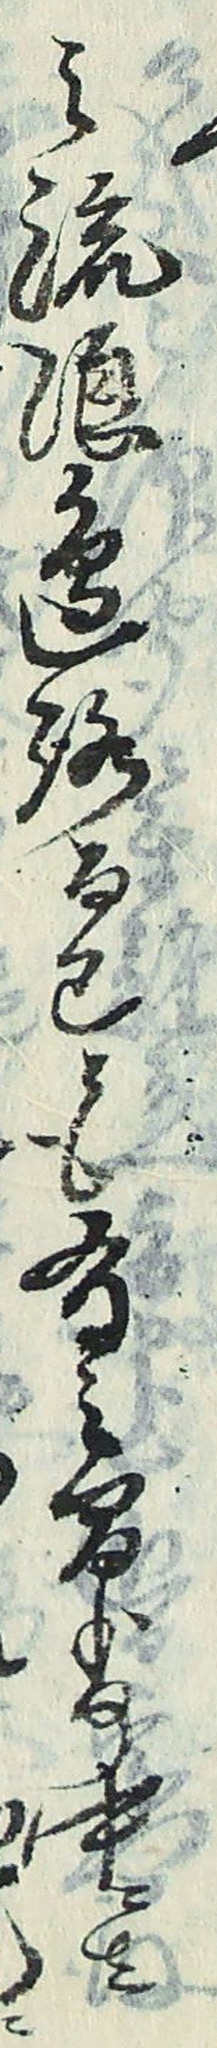之流浪邊路而已ニも有之間布中ニ者
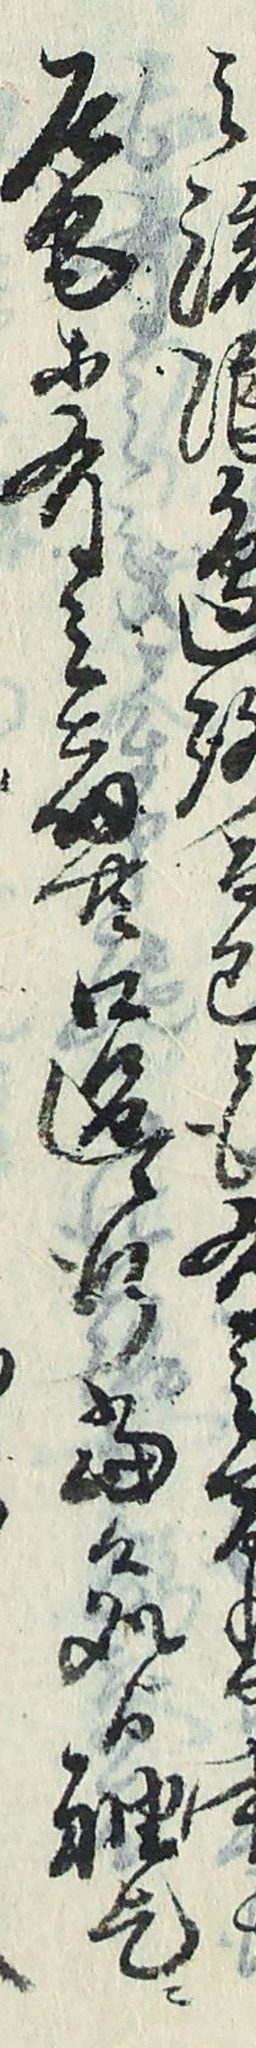居宅等有之者共口過ニ行當々処ゟ袖乞ニ
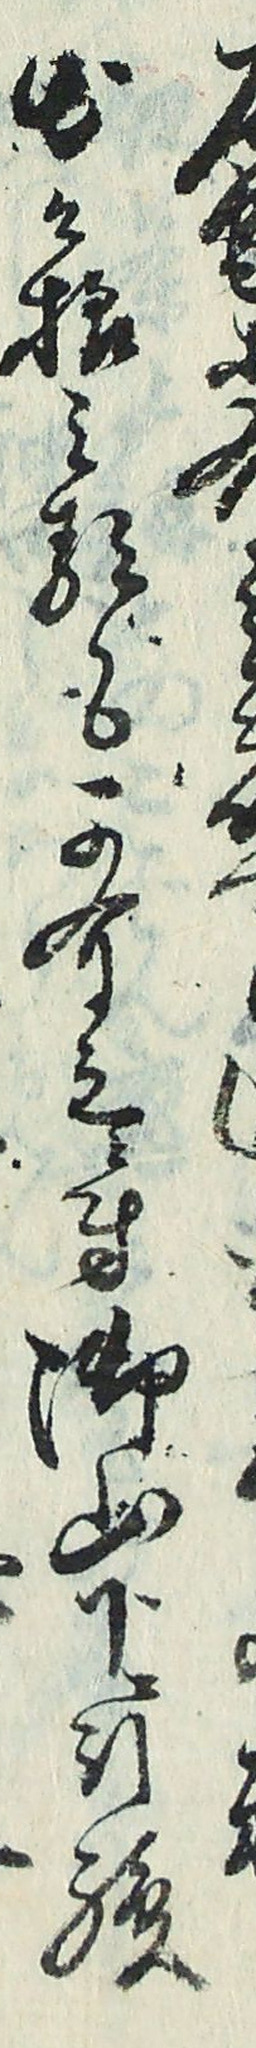出候様之類も可有之ニ付御山下ニ引續
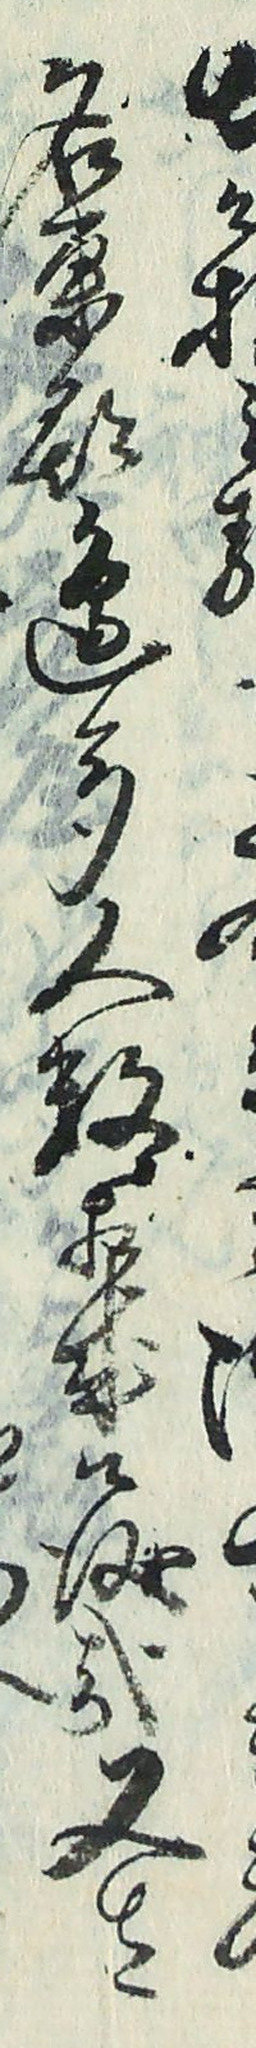名東郡邊多人数ニ相成候儀哉又者
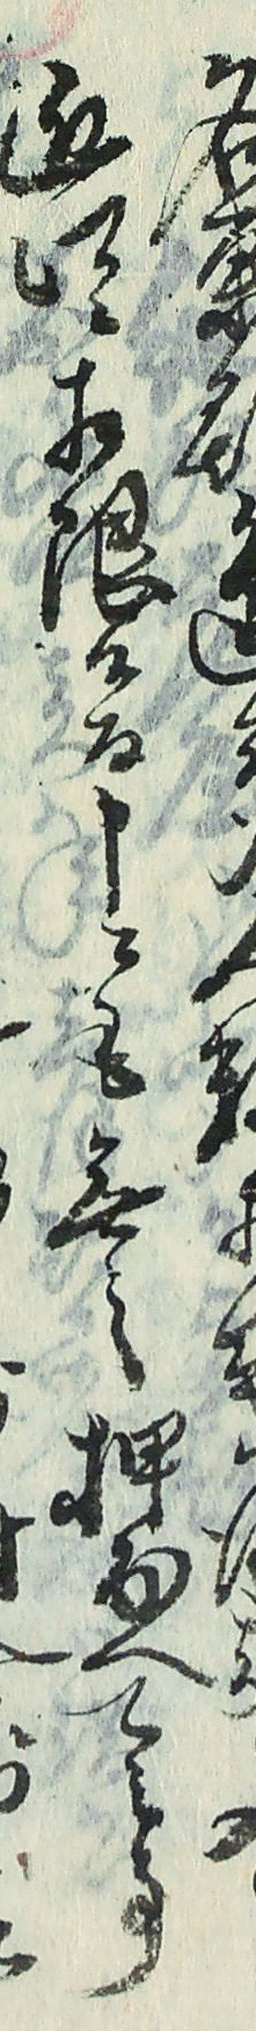近郷ニ相限候而申ニも無之押なへて之事
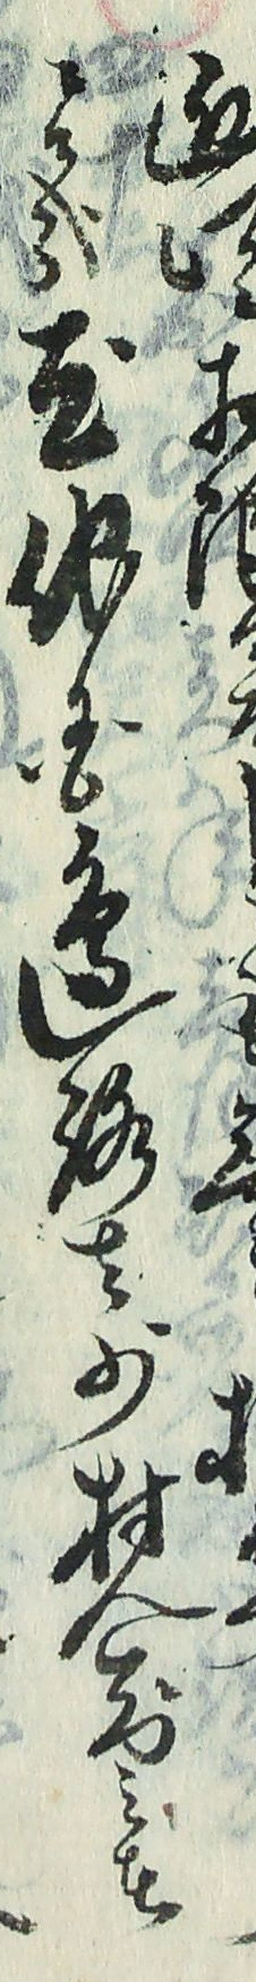ニ候哉尤他国邊路者少村人別之者
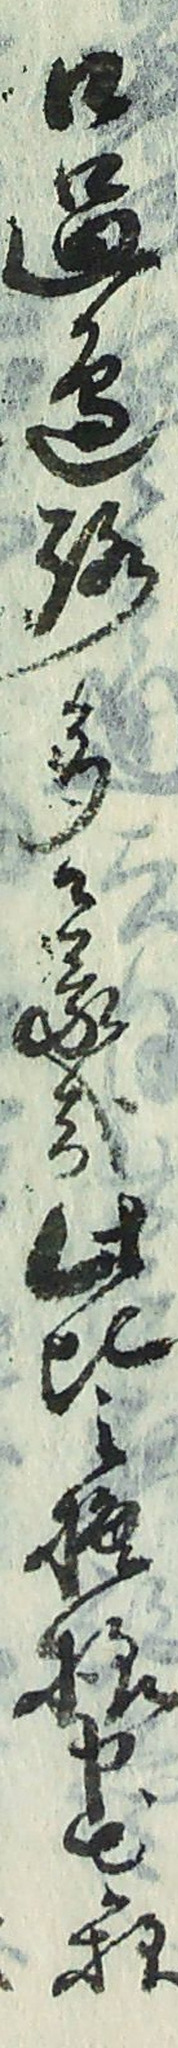口過邊路多候義哉此比之模様申出候様
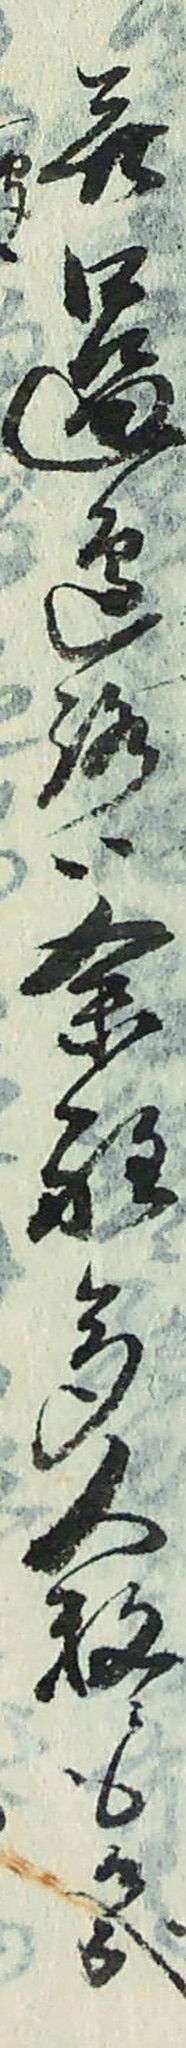幷口過邊路ハ余程多人数ニも候哉
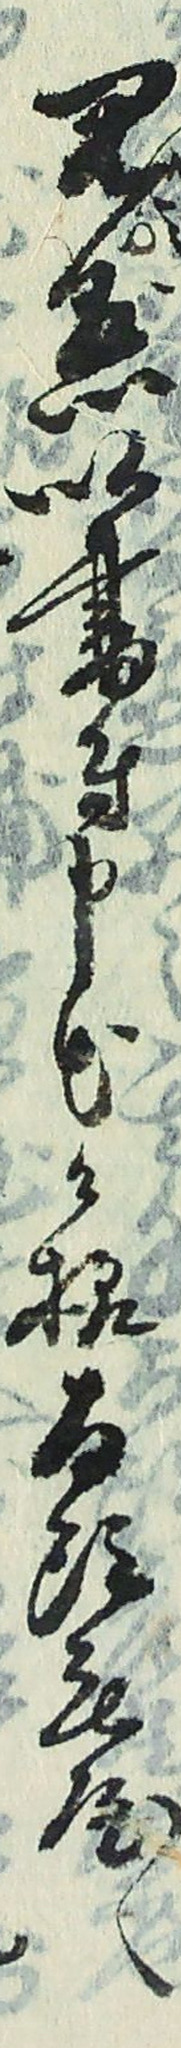見聞懸以書付申出候様与頭庄屋へ
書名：諸御趣意書并御下知向之写
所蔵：鳴門教育大学 Naruto University of Education
